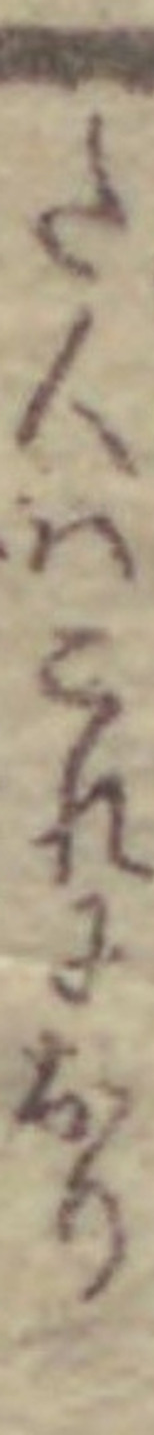た人はこれにおり
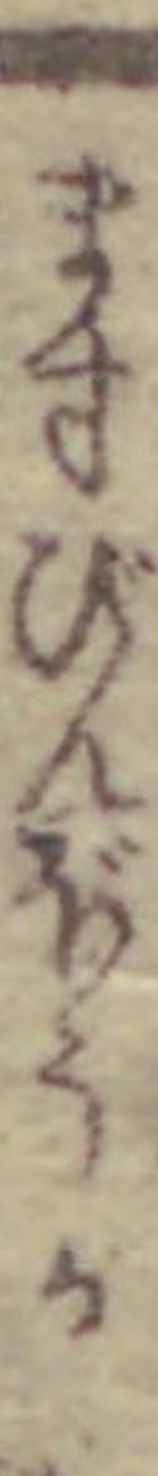ますびんぼうか
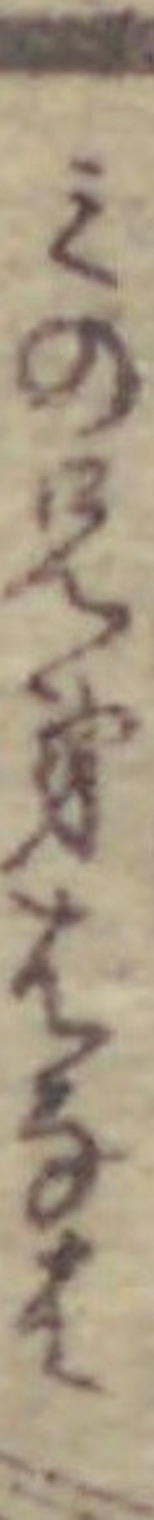みの兄弟はなは
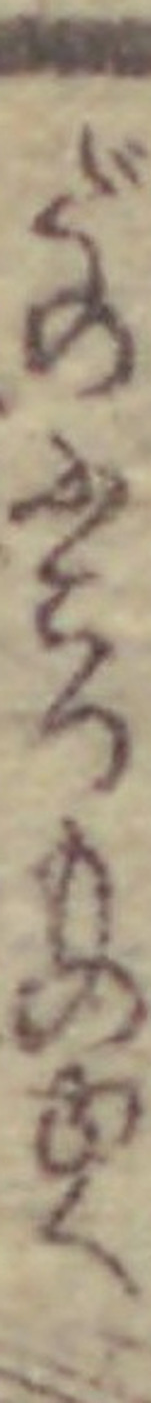だのふこつものゆへ
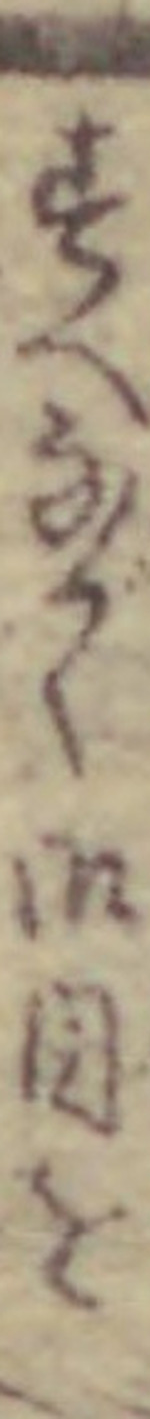すへながく御目を
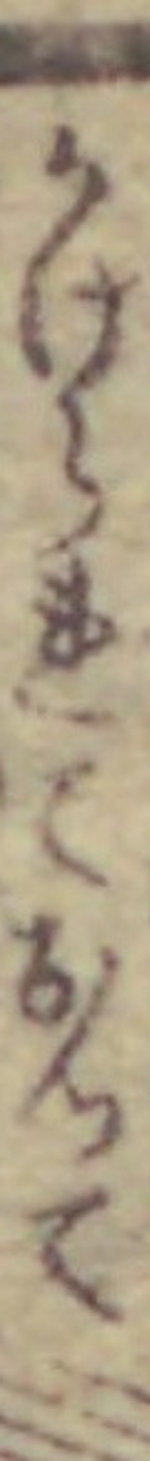かけられておつて
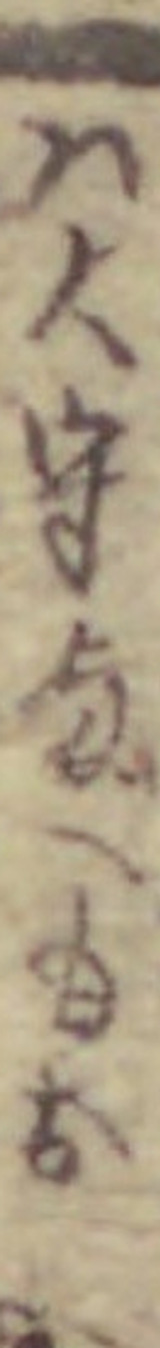は大守さまへもお
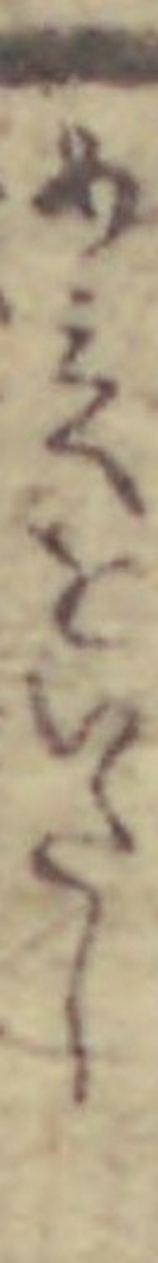めみへをいたし
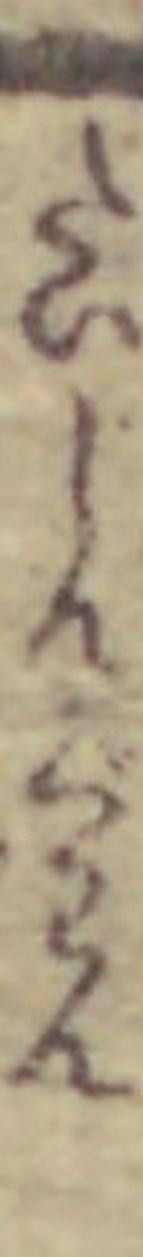たいしんぐわん
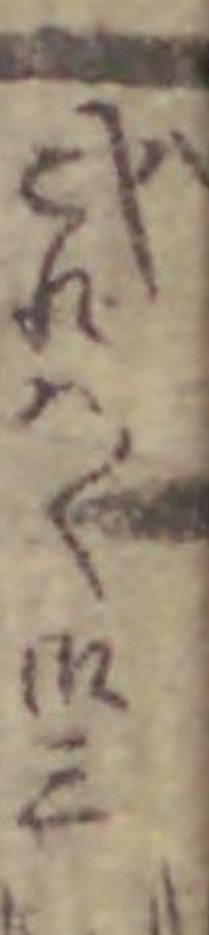「これは〳〵御三
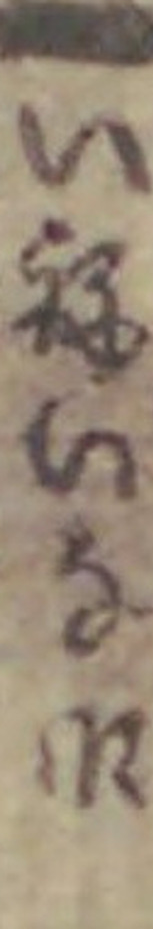いねいな御
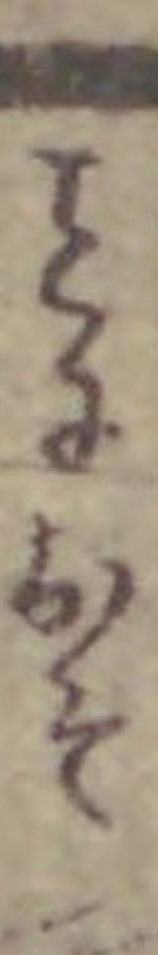ことにおそ
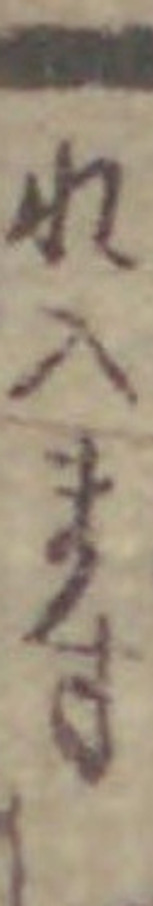れ入ます
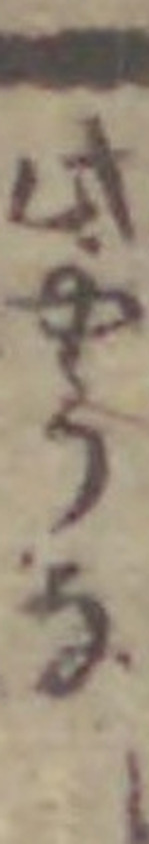此やうな
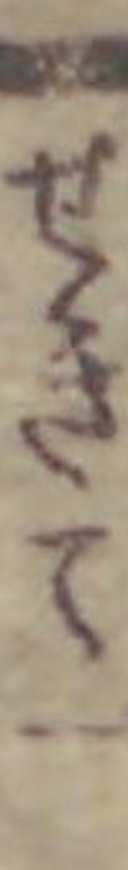せきて一
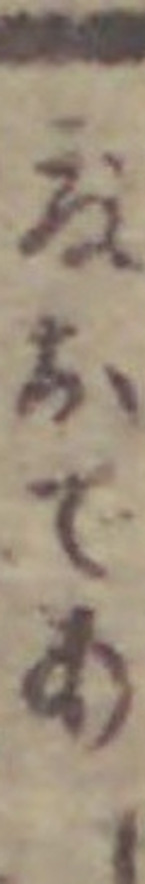度おてあ
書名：間似合嘘言曽我 3巻
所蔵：国立国会図書館 National Diet Library, JAPAN
